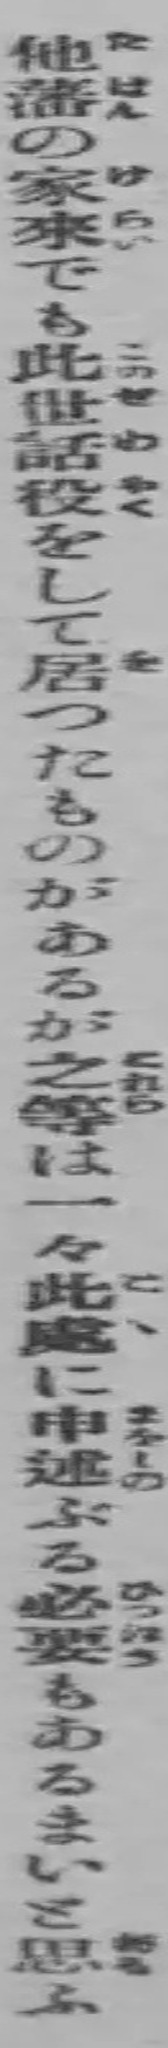他藩の家来でも此世話役をして居つたものがあるが之等は一々此処に申述ぶる必要もあるまいと思ふ
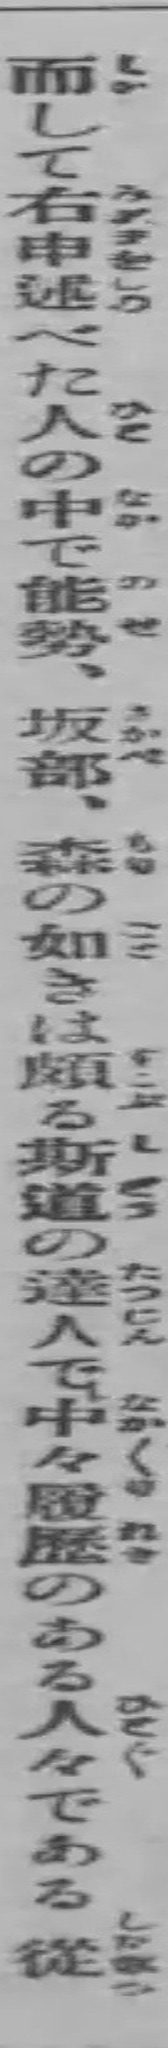而して右申述べた人の中で能勢、坂部、森の如きは頗る斯道の達人で中々履歴のある人々である従
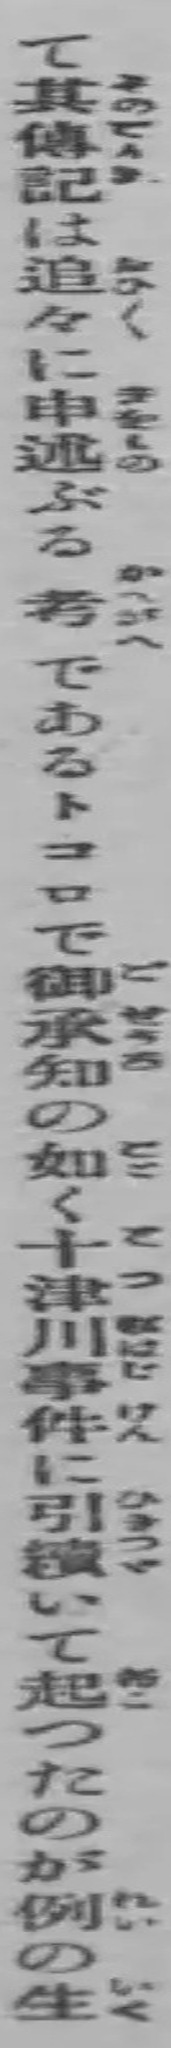て其伝記は追々に申述ぶる考であるトコロで御承知の如く十津川事件に引続いて起つたのが例の生
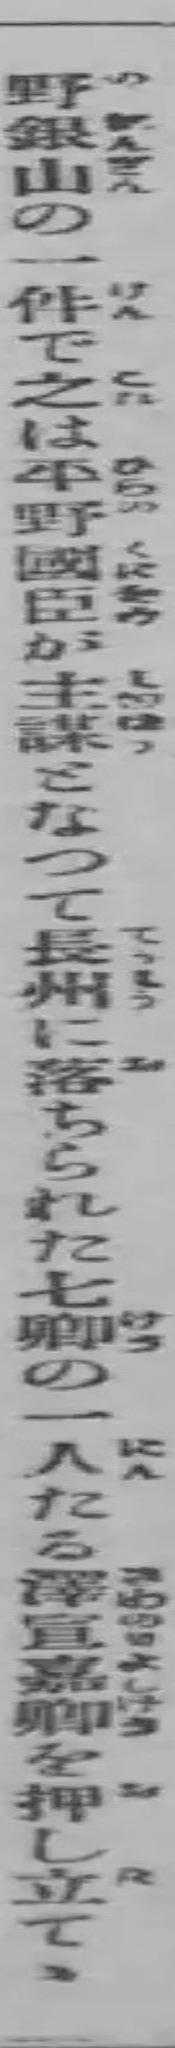野銀山の一件で之は平野国臣が首謀となつて長州に落ちられた七卿の一人たる澤宣嘉卿を押し立てゝ
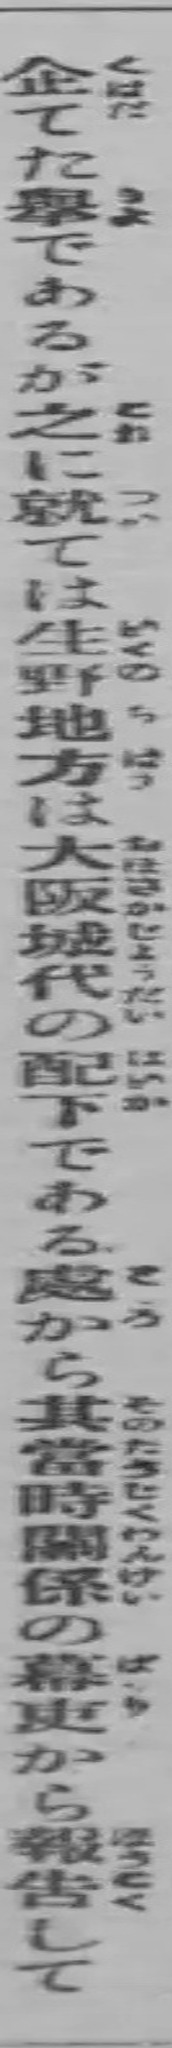企てた挙であるが之に就ては生野地方は大阪城代の配下である処から其当時関係の幕吏から報告して
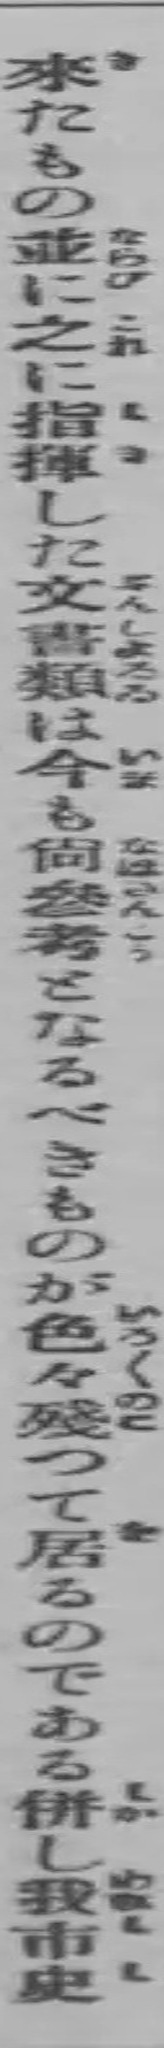来たもの並に之に指揮した文書類は今も尚参考となるべきものが色々残つて居るのである併し我市史
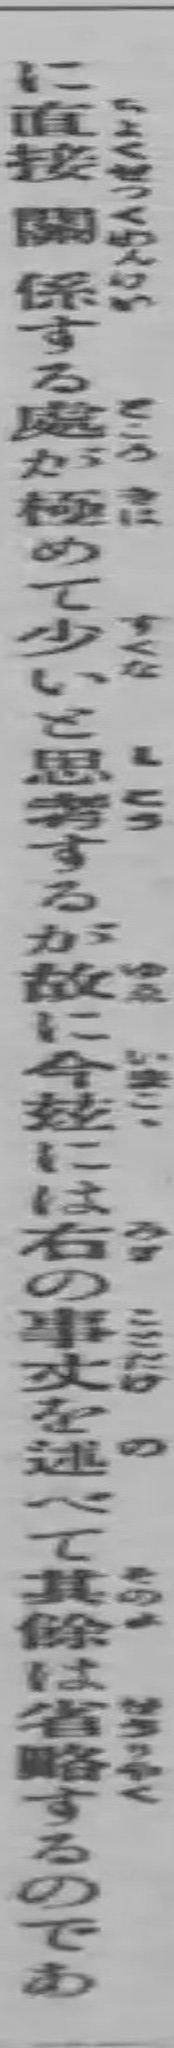に直接関係する処が極めて少いと思考するが故に今茲には右の事丈を述べて其余は省略するのであ
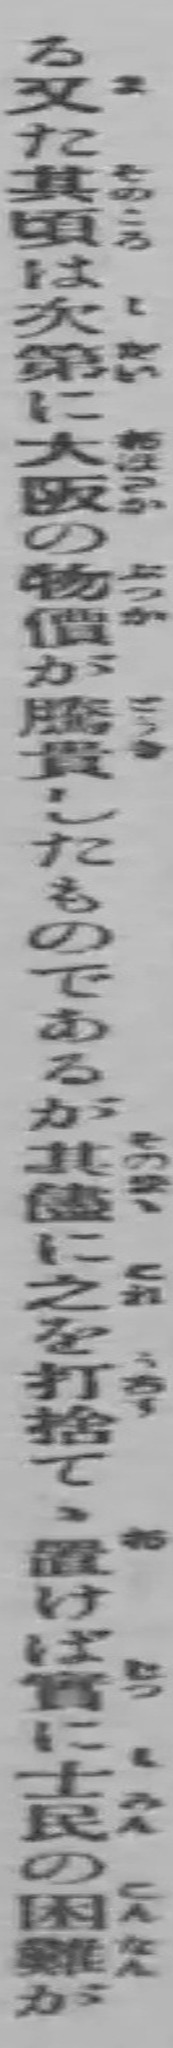物価騰貴る又た其頃は次第に大阪の物価が騰貴したものであるが其侭に之を打捨てゝ置けば実に士民の困難が
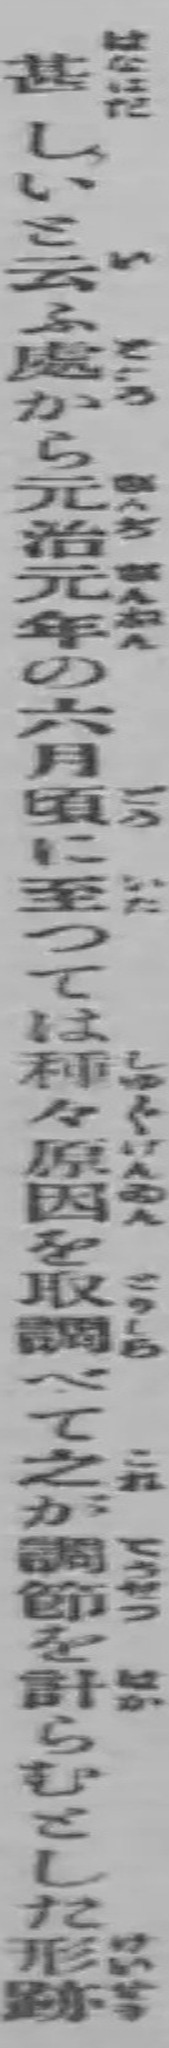甚しいと云ふ処から元治元年の六月頃に至つては種々原因を取調べて之が調節を計らむとした形跡
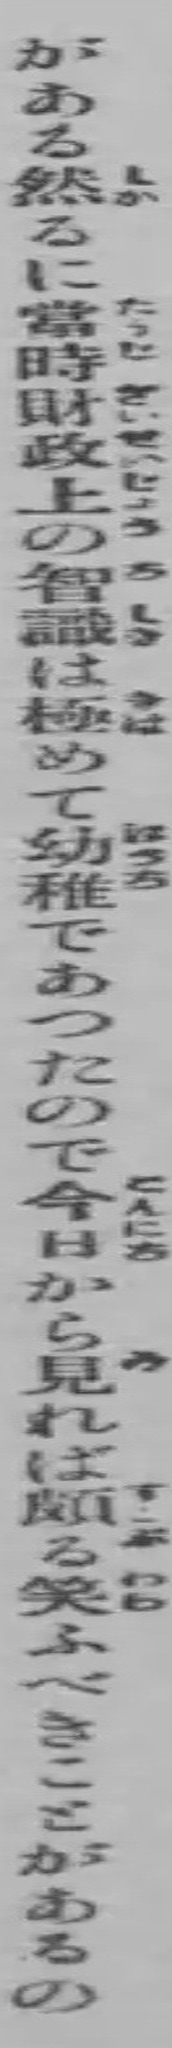がある然るに当時財政上の知識は極めて幼稚であつたので今日から見れば頗る笑ふべきことがあるの
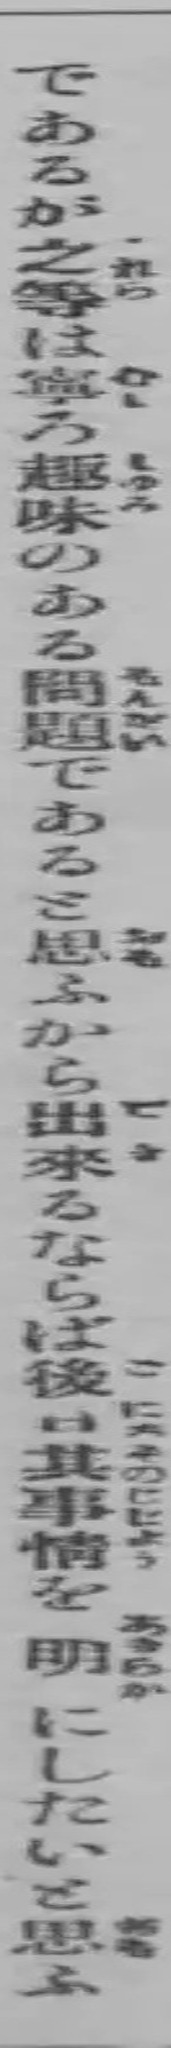であるが之等は寧ろ趣味のある問題であると思ふから出来るならば後日其事情を明にしたいと思ふ
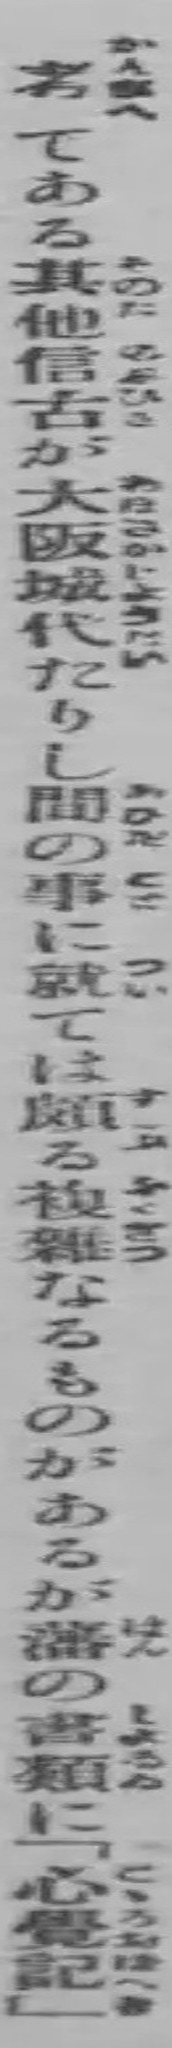心覚記考てある其他信古が大阪城代たりし間の事に就ては頗る複雑なるものがあるが藩の書類に「心覚記」
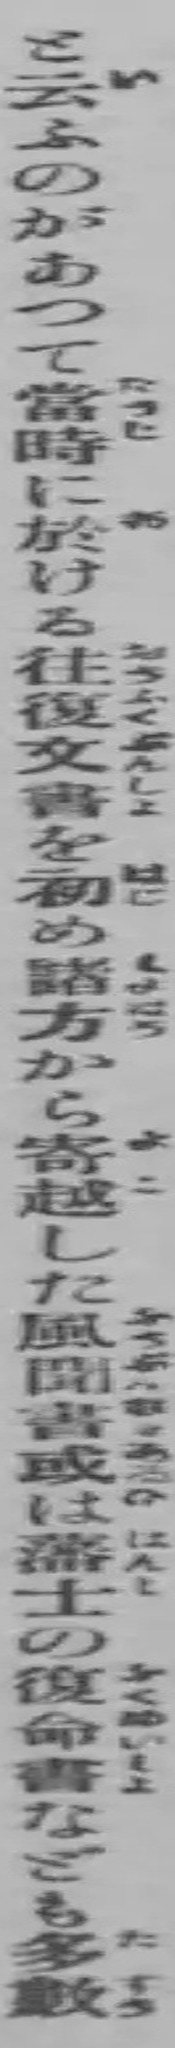と云ふのがあつて当時に於ける往復文書を初め諸方から寄越した風聞書或は藩士の復命書なども多数
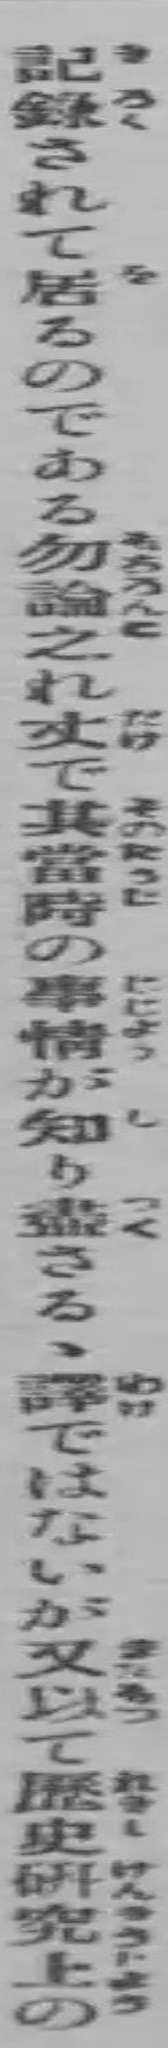記録されて居るのである勿論之れ丈で其当時の事情が知り盡さるゝ訳ではないが又以て歴史研究上の
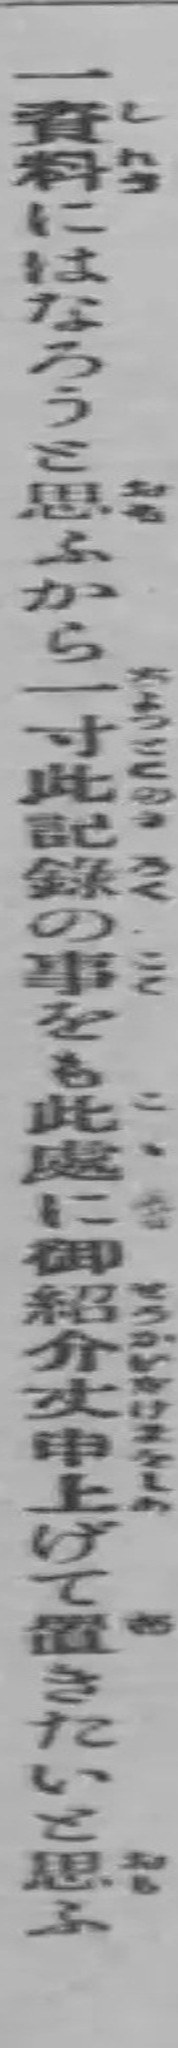一資料にはなろうと思ふから一寸此記録の事をも此処に御紹介丈申上げて置きたいと思ふ

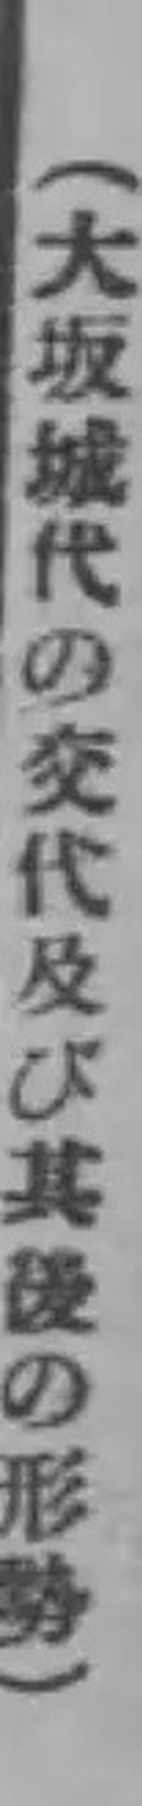⦿大阪城代の交代及び其後の形勢
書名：豊橋市史談
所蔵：国立国会図書館 National Diet Library, JAPAN
